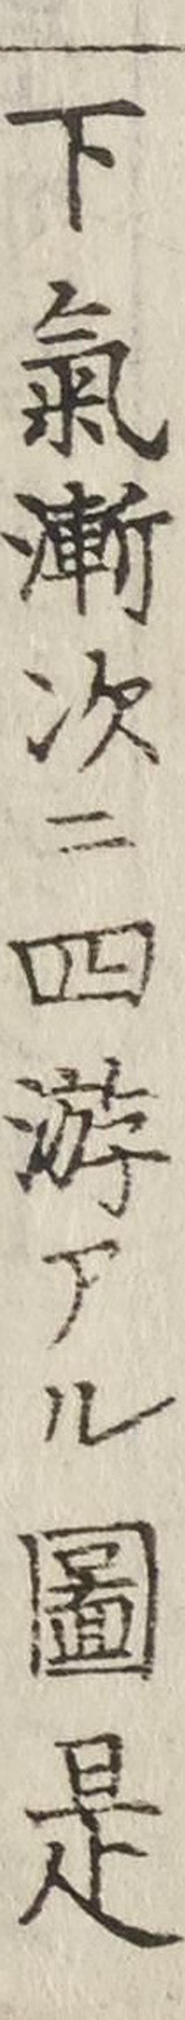下気漸次ニ四游アル図是
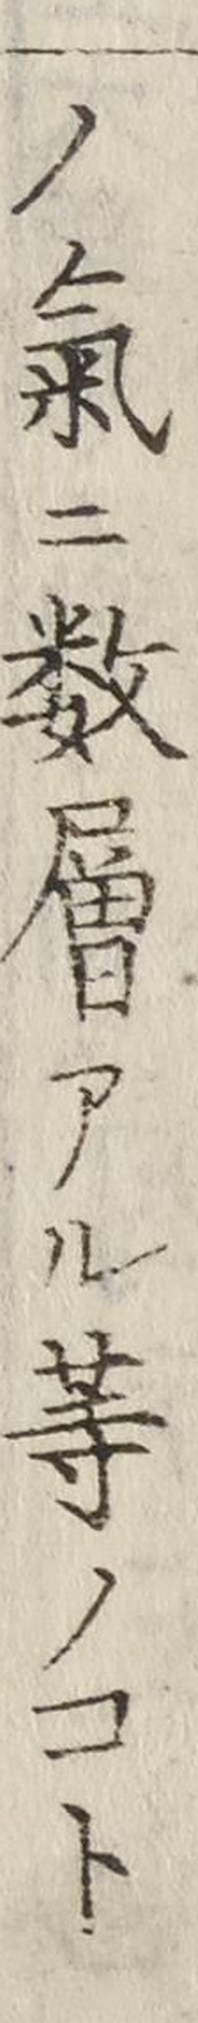ノ気ニ数層アル等ノコト
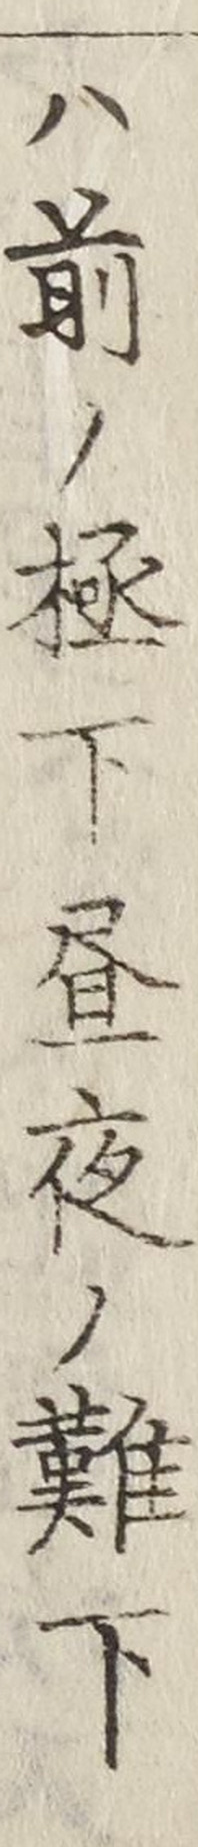ハ前ノ極下昼夜ノ難下
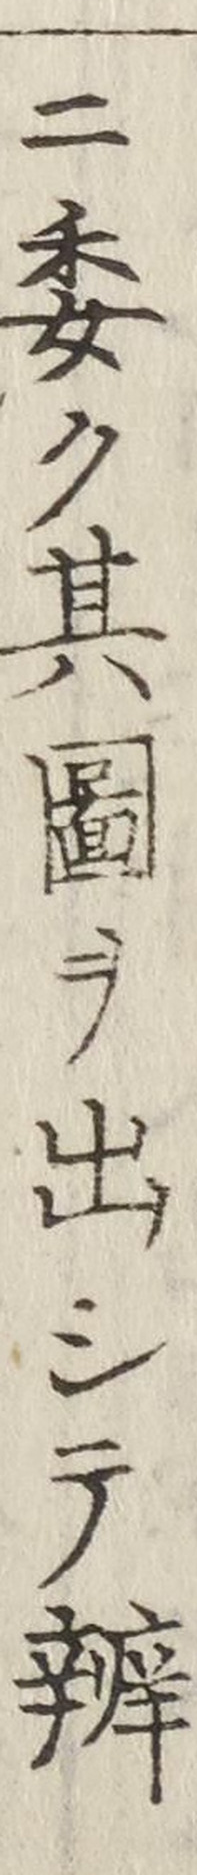ニ委ク其図ヲ出シテ弁
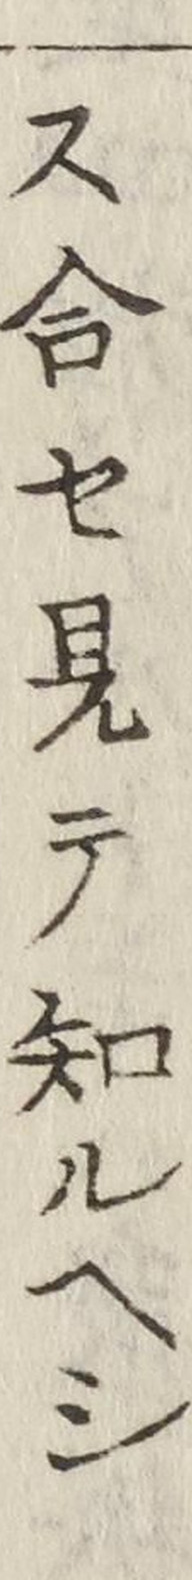ス合セ見テ知ルヘシ
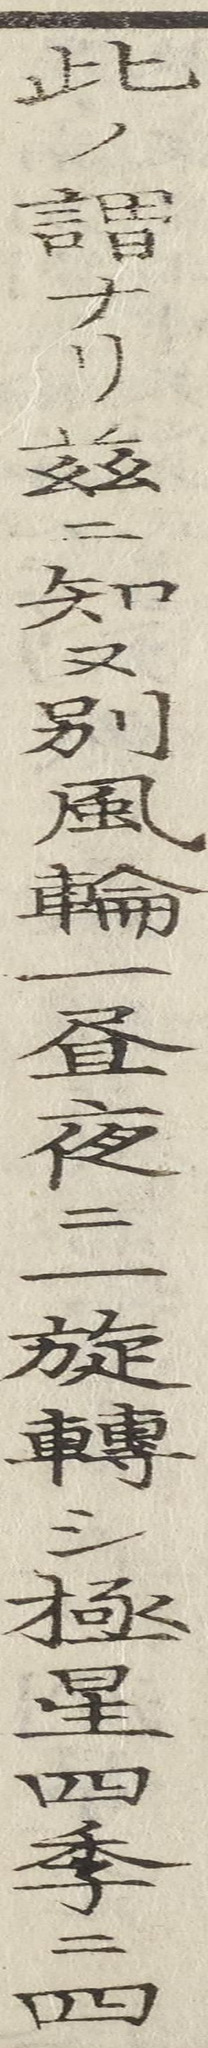此ノ謂ナリ茲ニ知又別風輪一昼夜ニ一旋転シ極星四季ニ四
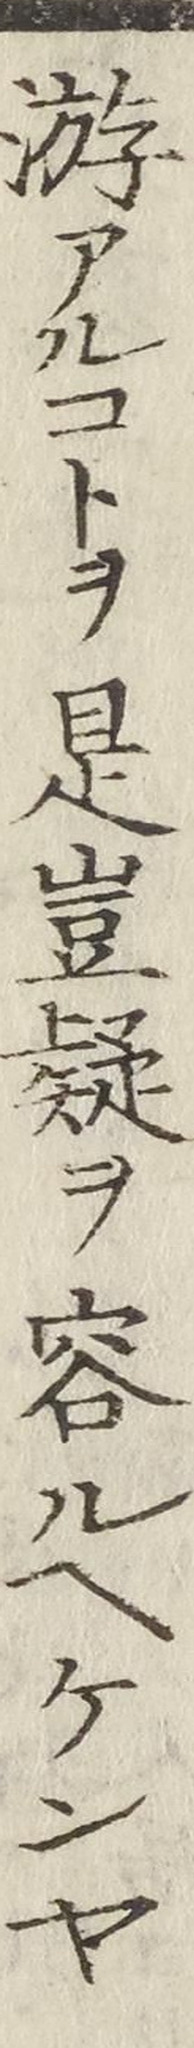游アルコトヲ是豈疑ヲ容ルヘケンヤ
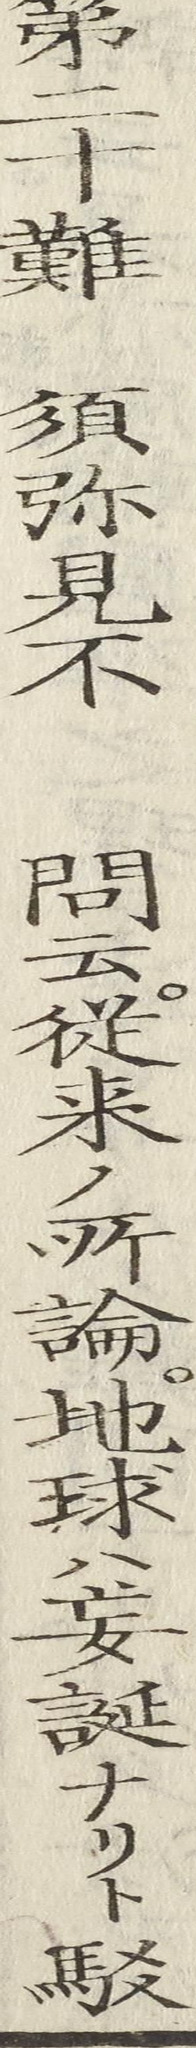第二十難須弥見不問云。従来ノ所論。地球ハ妄誕ナリト駁
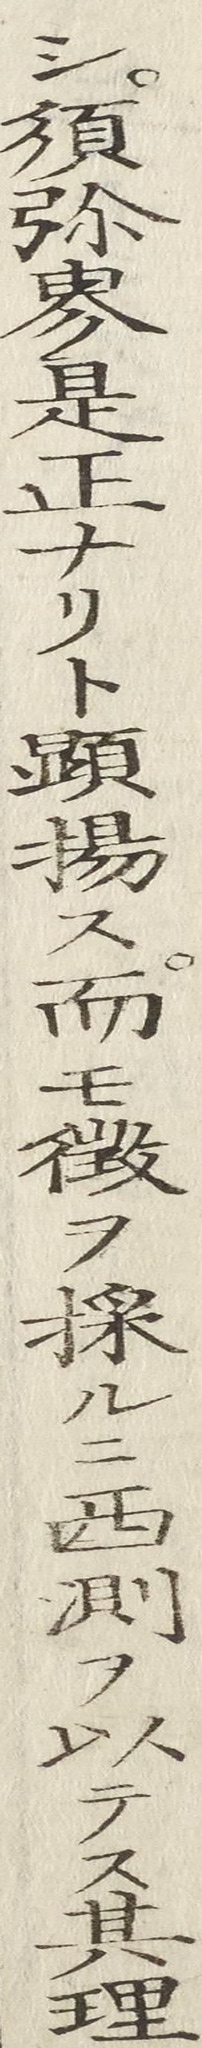シ。須弥界是正ナリト顕揚ス。而モ徴フ採ルニ西測フ以テス其理
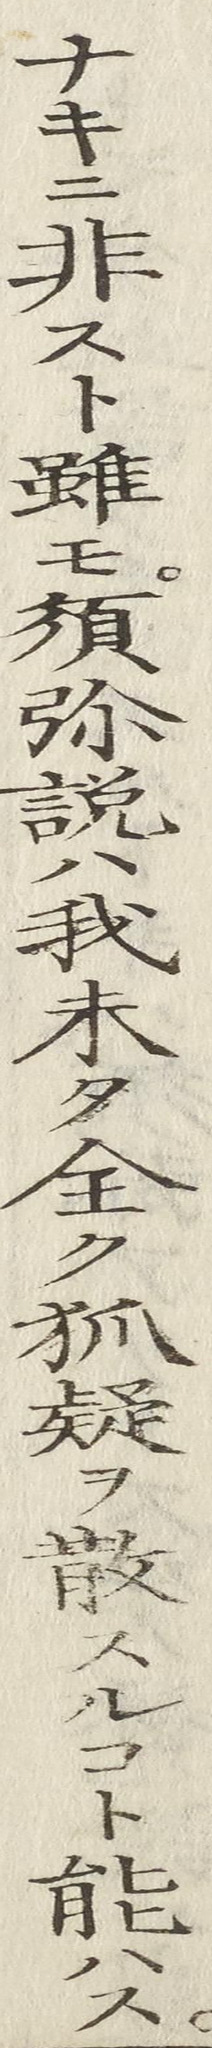ナキニ非スト雖モ。須弥説ハ我未タ全ク狐疑ヲ散スルコト能ハス。
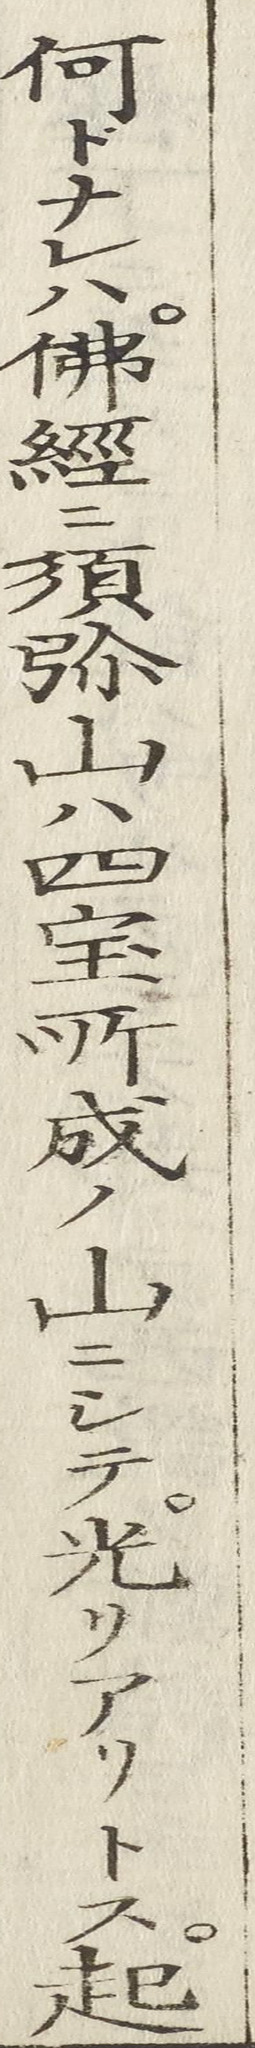何トナレハ。仏経ニ須弥山ハ四宝所成ノ山ニシテ。光リアリトス。起
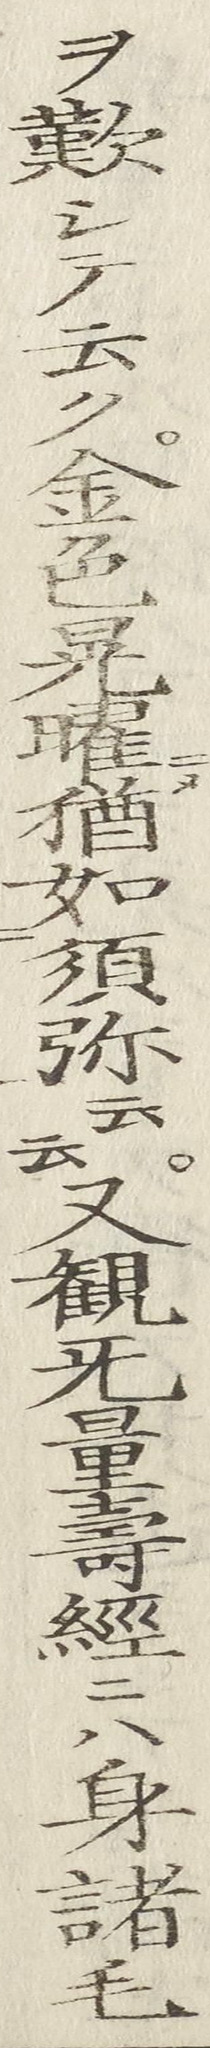ヲ歎シテ云ク。金色晃曜猶如ニ須弥云云。又観旡量寿経ニハ身諸毛
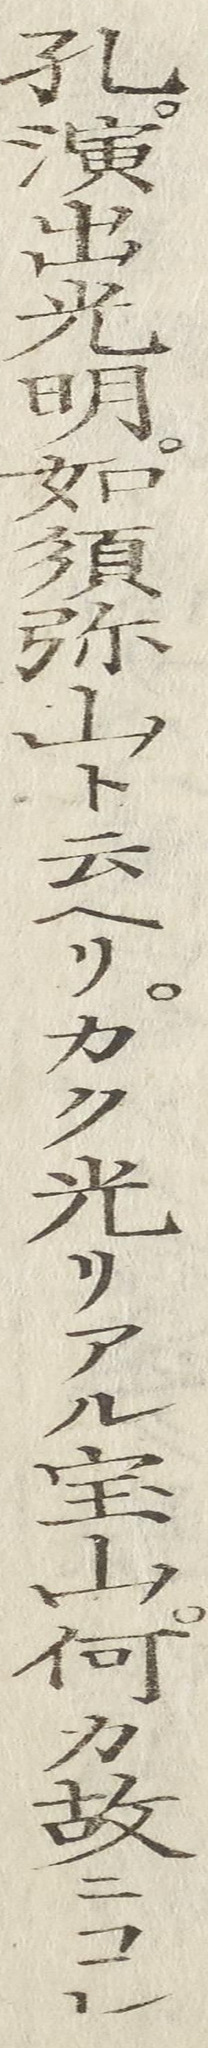孔。演出光明。如須弥山ト云ヘリ。カク光リアル宝山。何カ故ニコレ
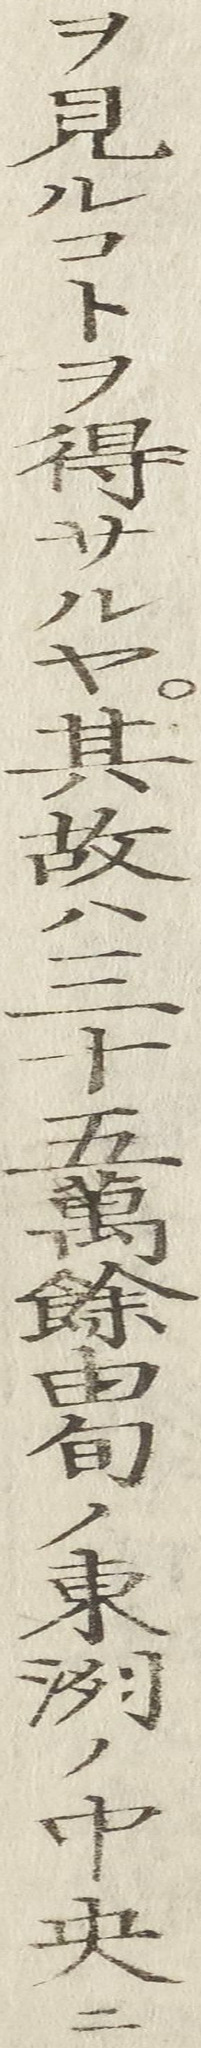ヲ見ルコトヲ得サルヤ。其故ハ三十五万余由旬ノ東洌ノ中央ニ
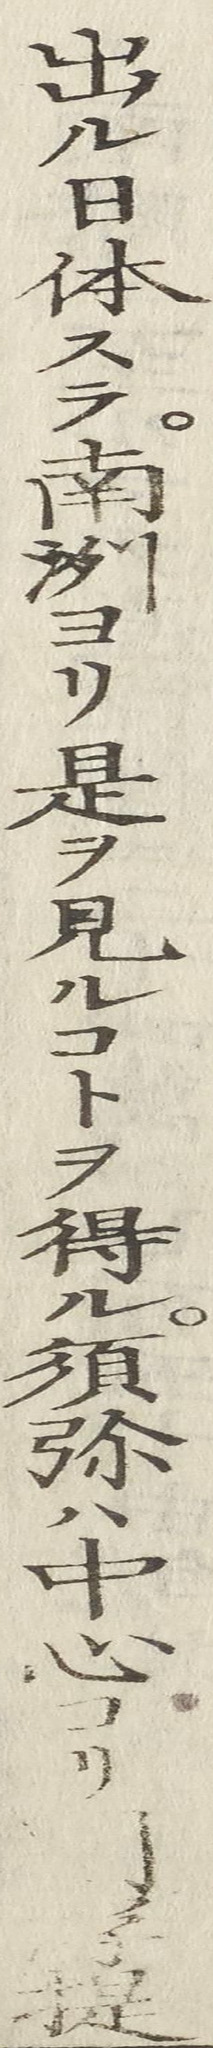出ル日体スラ。南洌ヨリ是ヲ見ルコトヲ得ル。須弥ハ中心ヨリ浮？提

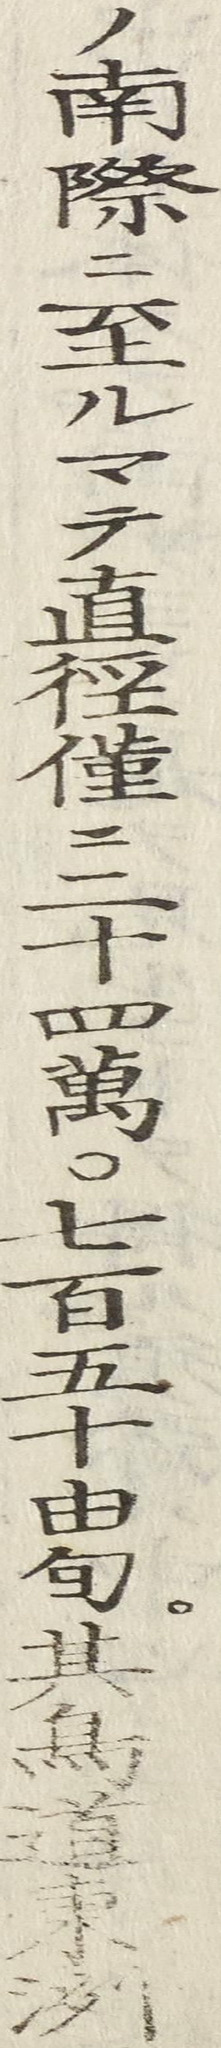ノ南際ニ至ルマテ直径僅ニ二十四万〇七百五十由旬。其鳥道東洌
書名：護法新論　二編　中
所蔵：東京大学地震研究所図書室 Earthquake Research Institute Library, The University of Tokyo, JAPAN
